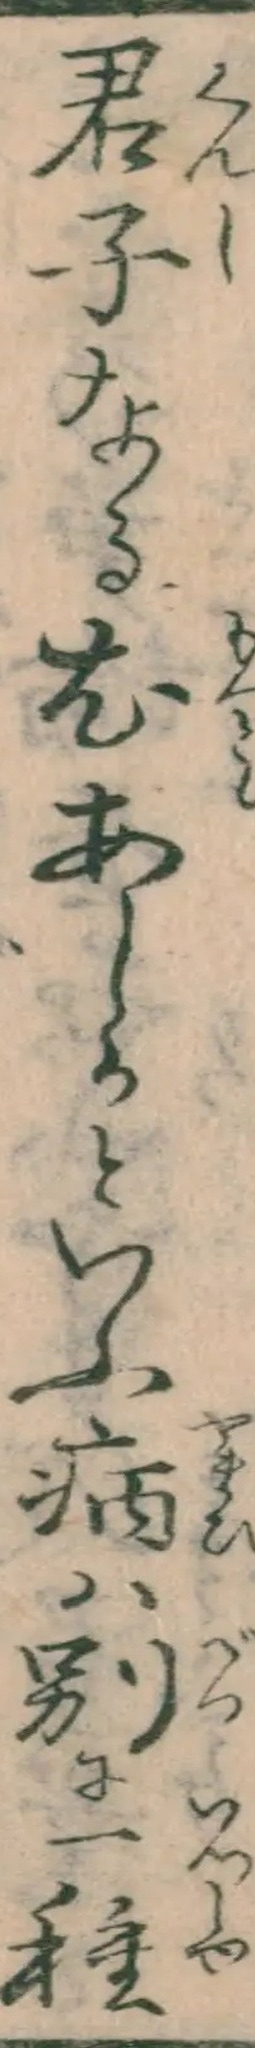君子なる。尤あしかといふ病は別に一種
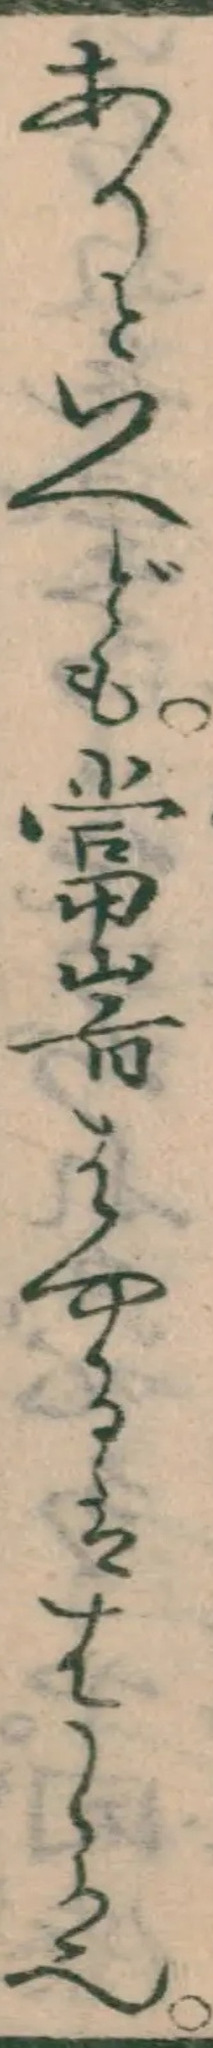ありといへども。当時はやるははしか也。
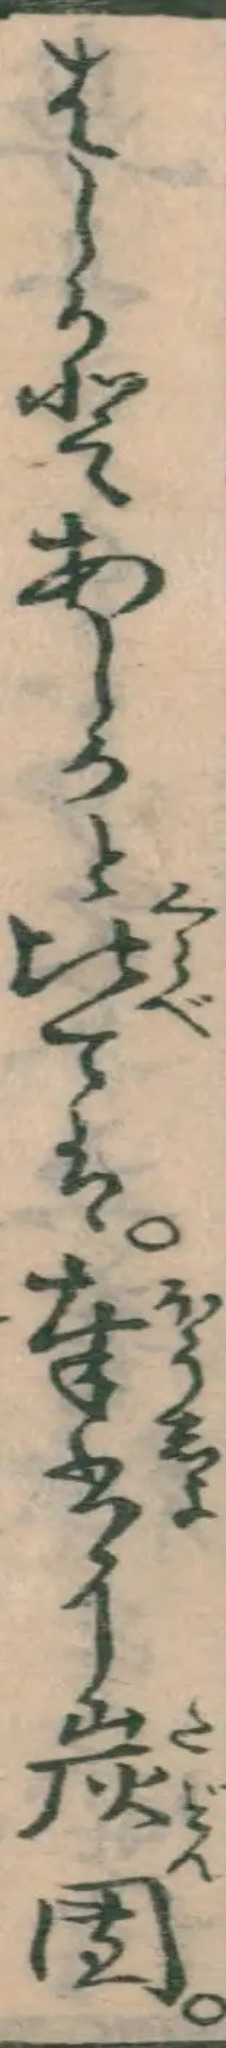はしかとあしかと比ては。奉書に炭団。
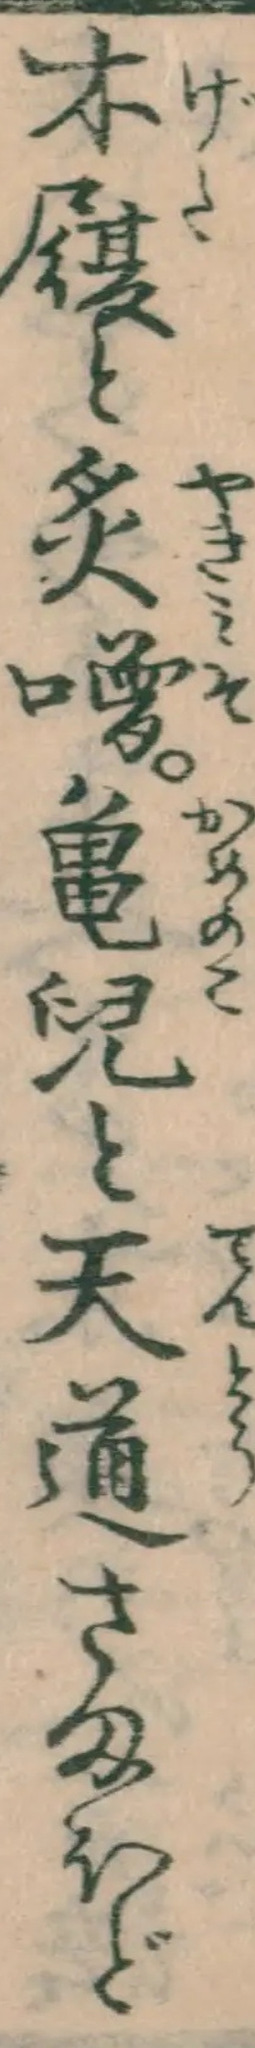木履と炙噌。亀児と天道さまほど
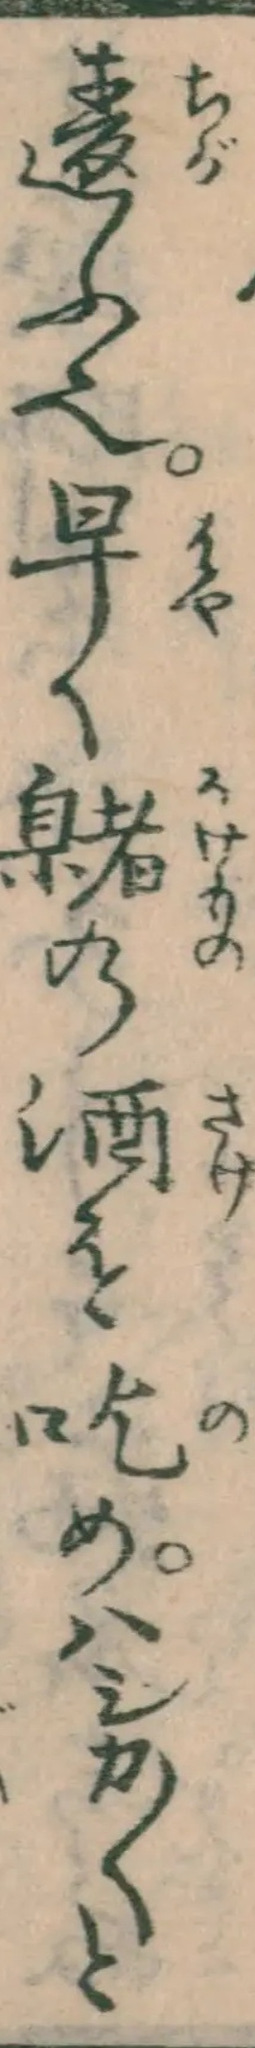違ふ也。早く賭の酒を吃め。ハシカ〳〵と
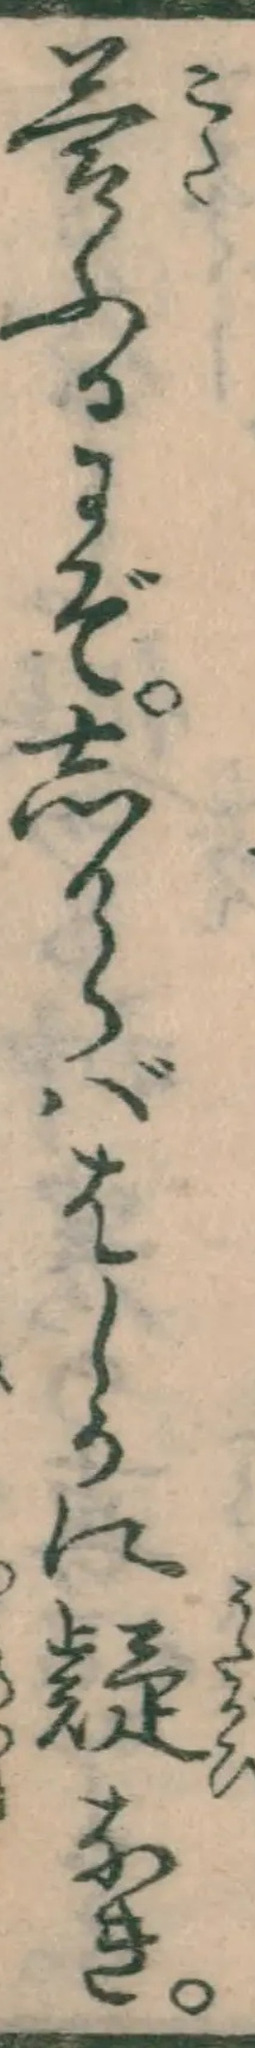答ふるにぞ。しからばはしかに疑なき。
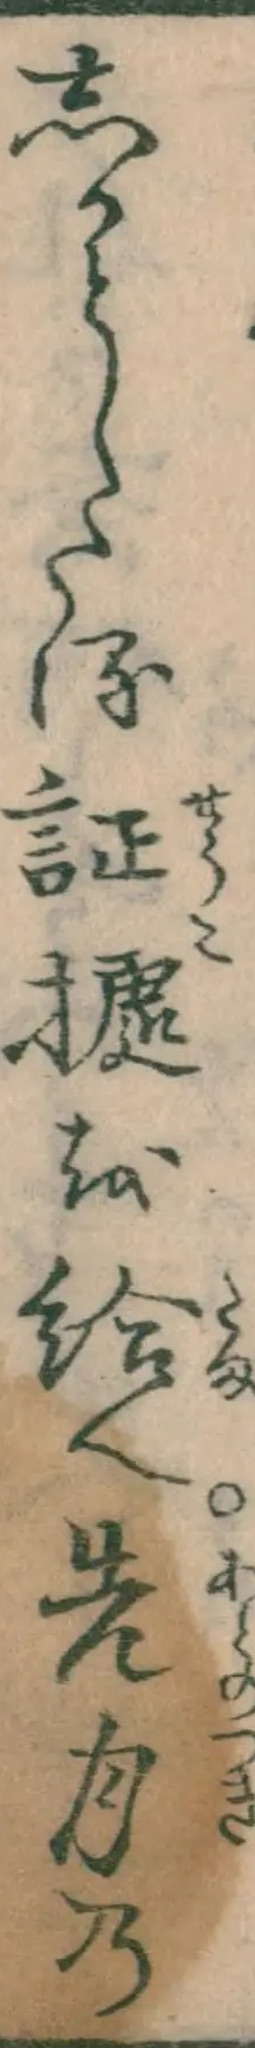しかとしたる証拠を給へ。先月の
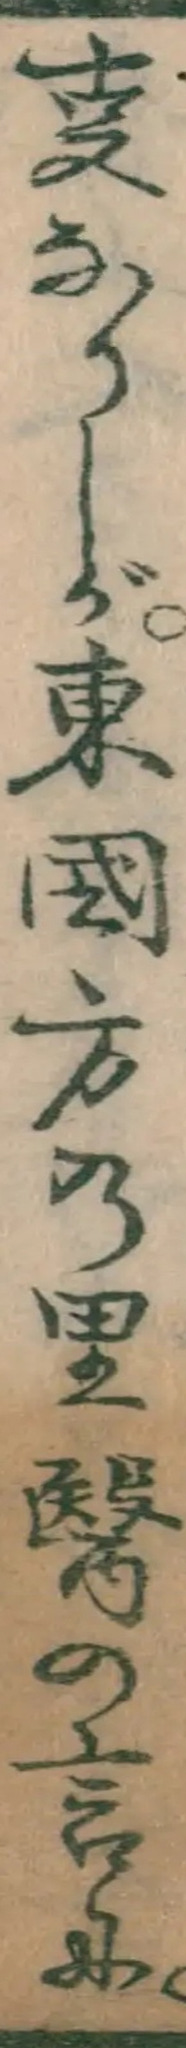事なりしが。東国方の里医の言に。
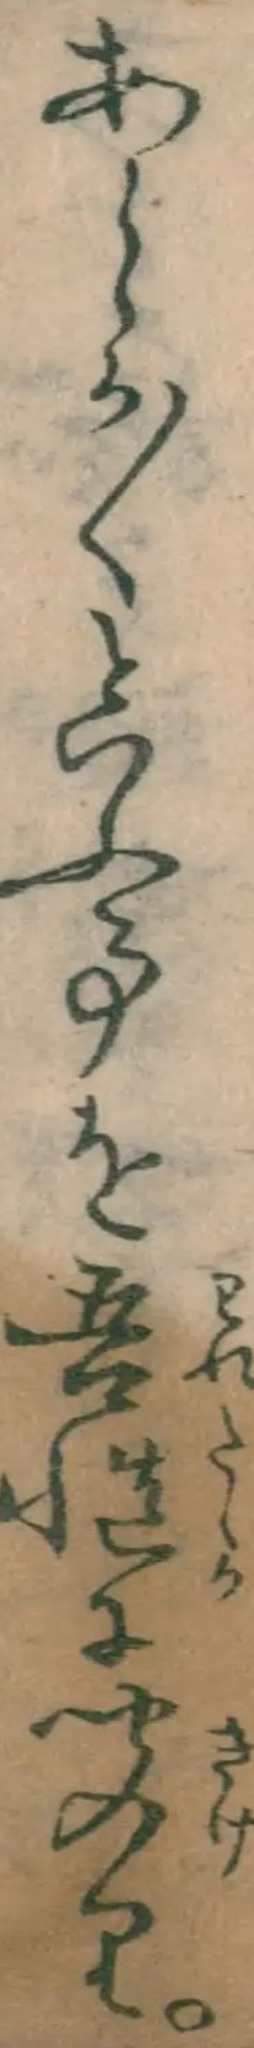あしか〳〵といふ事を吾慥に聞り。

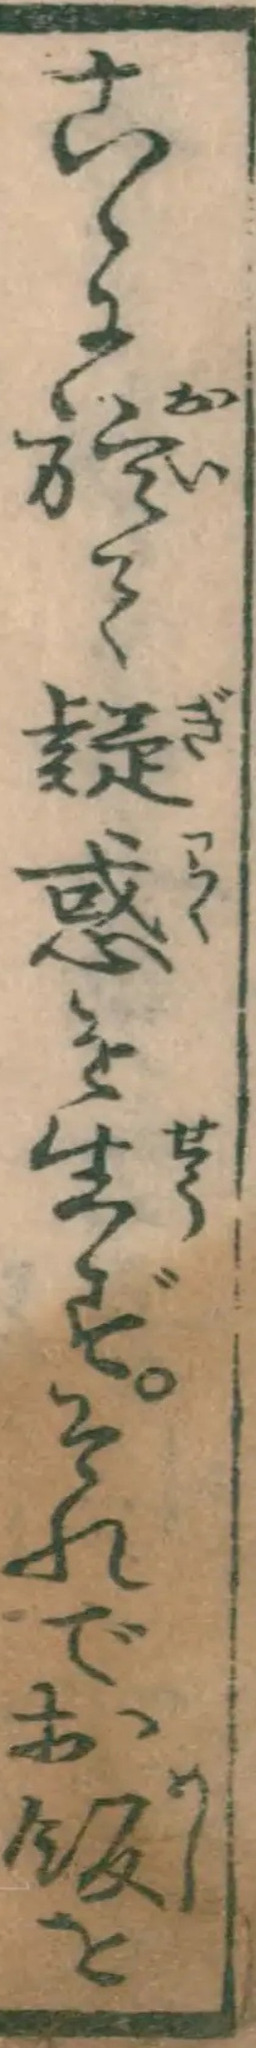こゝに於て疑惑を生ず。それでお飯を
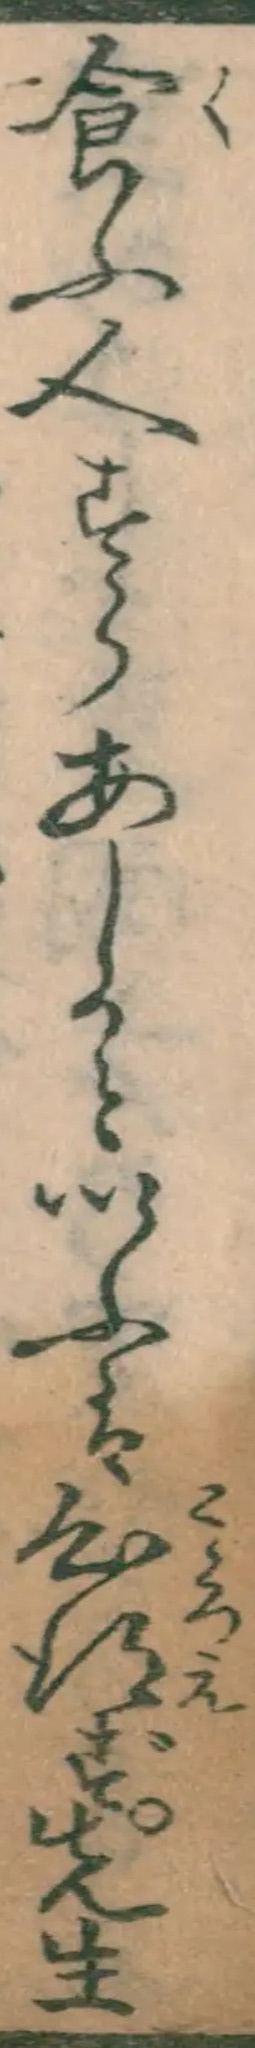食ふ人すらあしかといふは心得す。先生
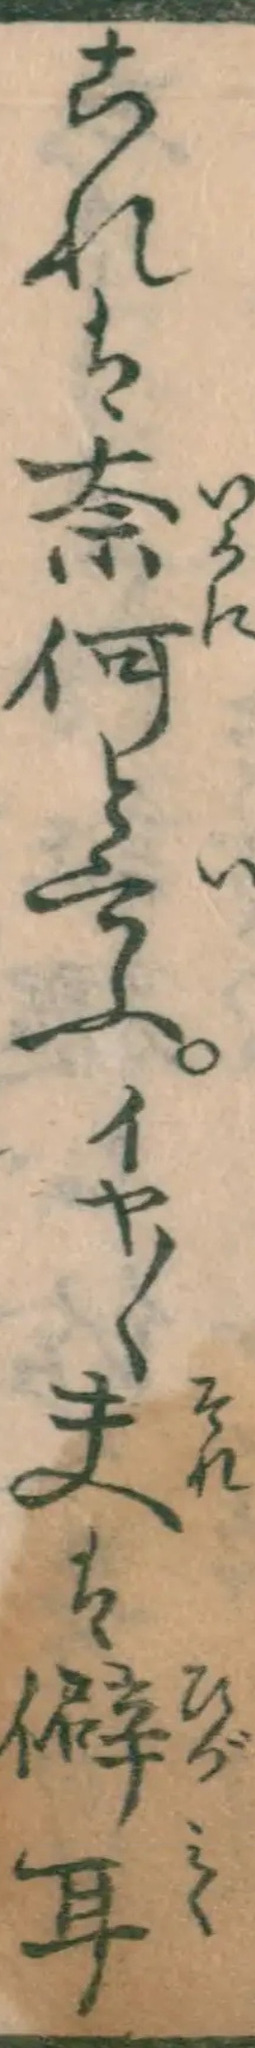これは奈何と言ふ。イヤ〳〵夫は僻耳
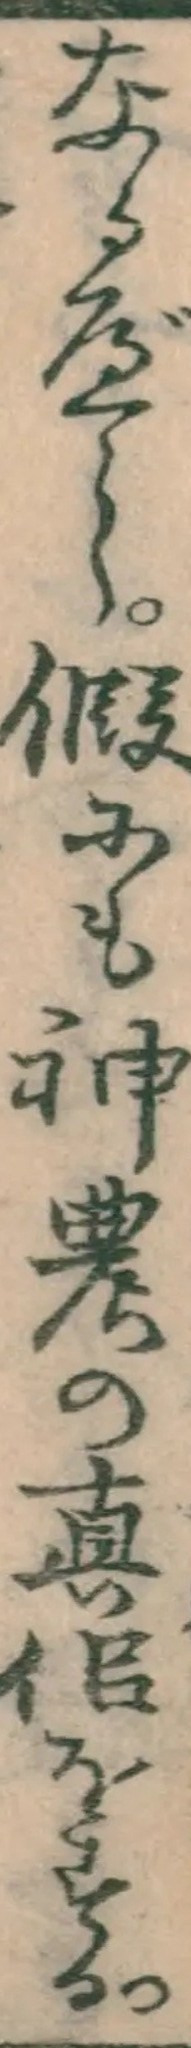なるべし。假にも神農の真佀をする。
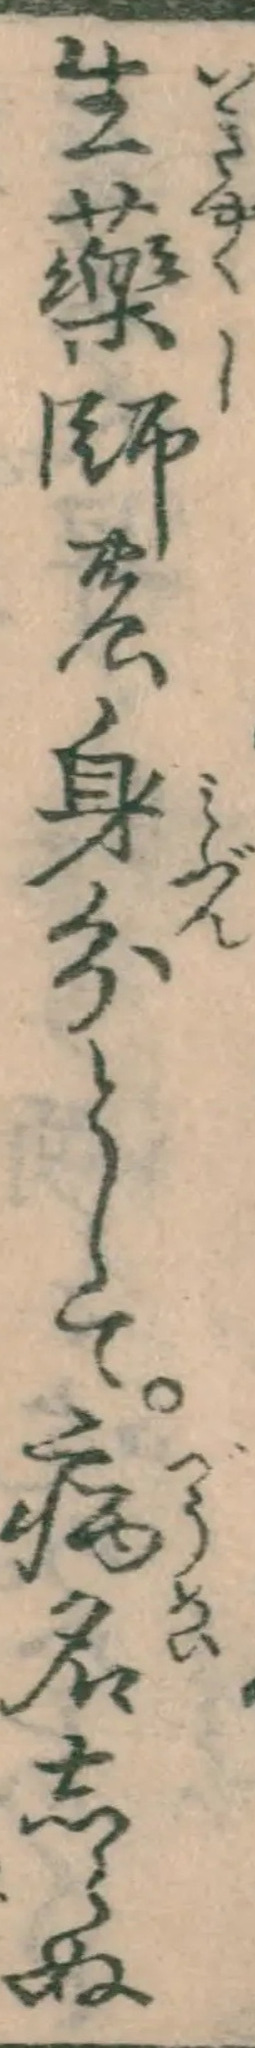生薬師の身分として。病名しらぬ
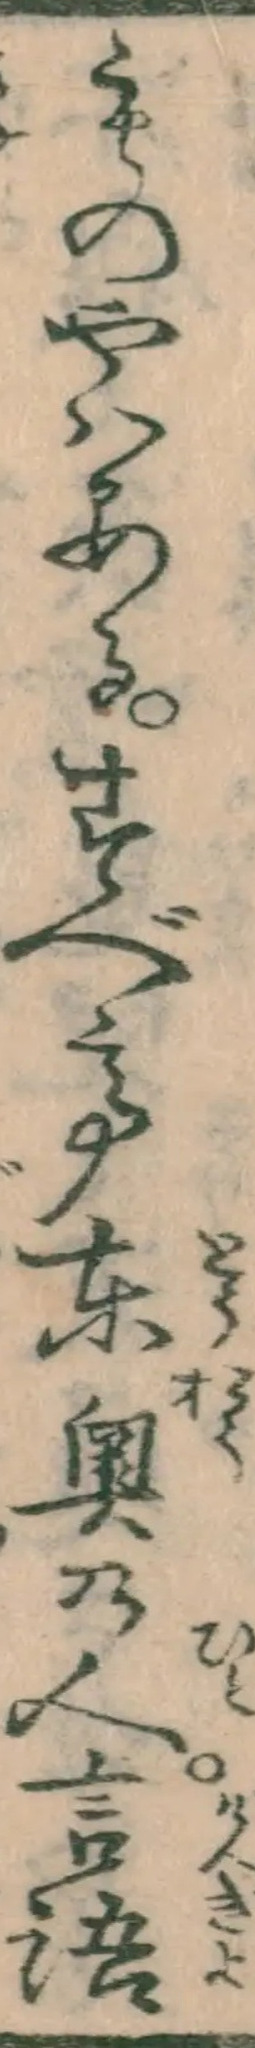ものやはある。すべて東奥の人。言語
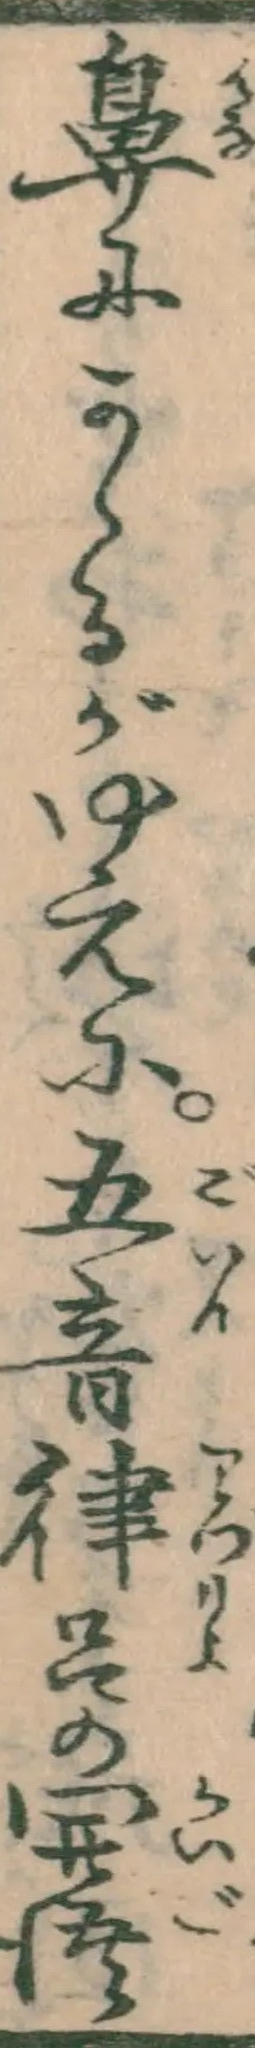鼻にかゝがるゆえに。五音律呂の開悟
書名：麻疹戯言
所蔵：国立国会図書館 National Diet Library, JAPAN
